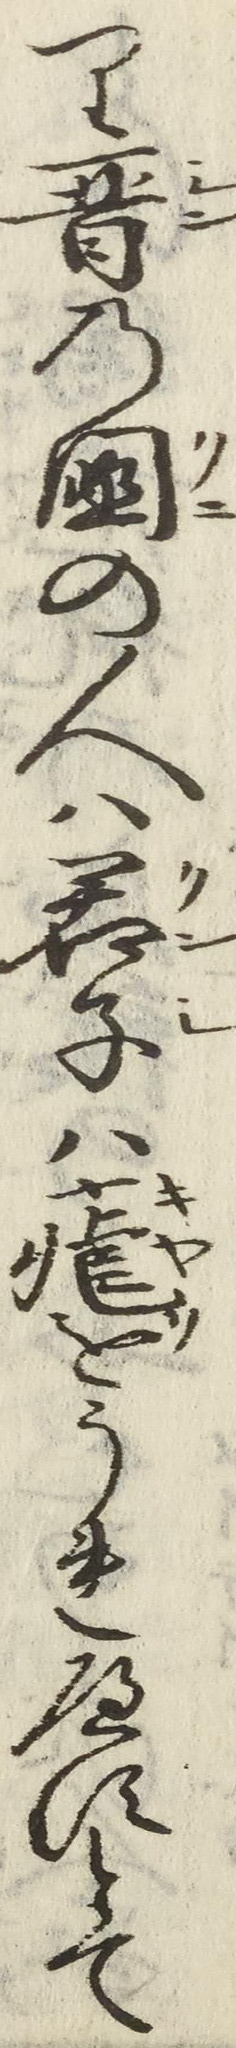り晋の国の人は君子は瘧をうれへすとて
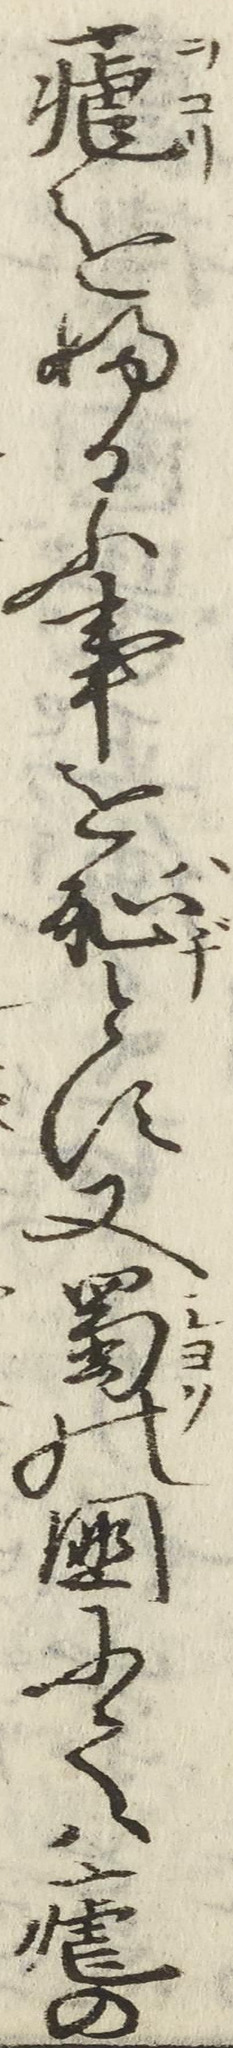瘧をふるふ事を恥とす又蜀の国にては瘧の
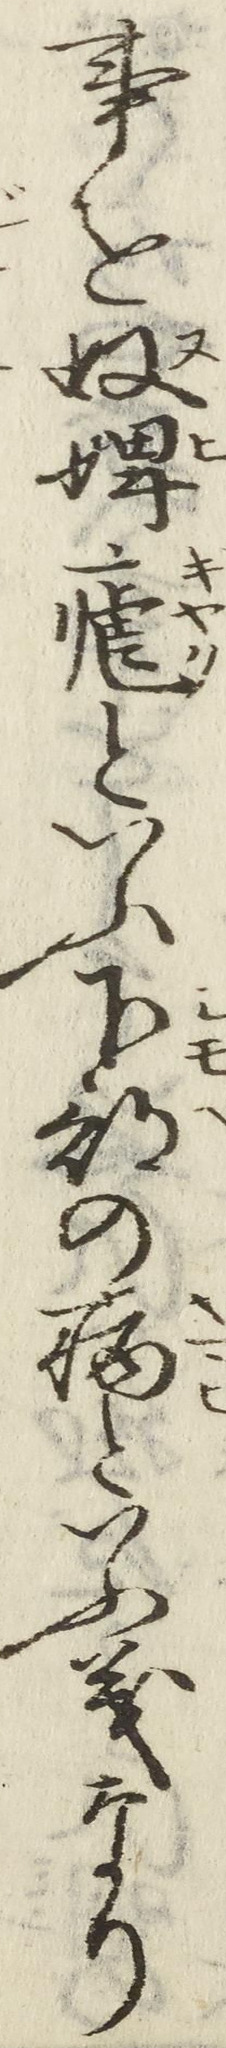事を奴婢瘧といふ下部の病といふ義なり
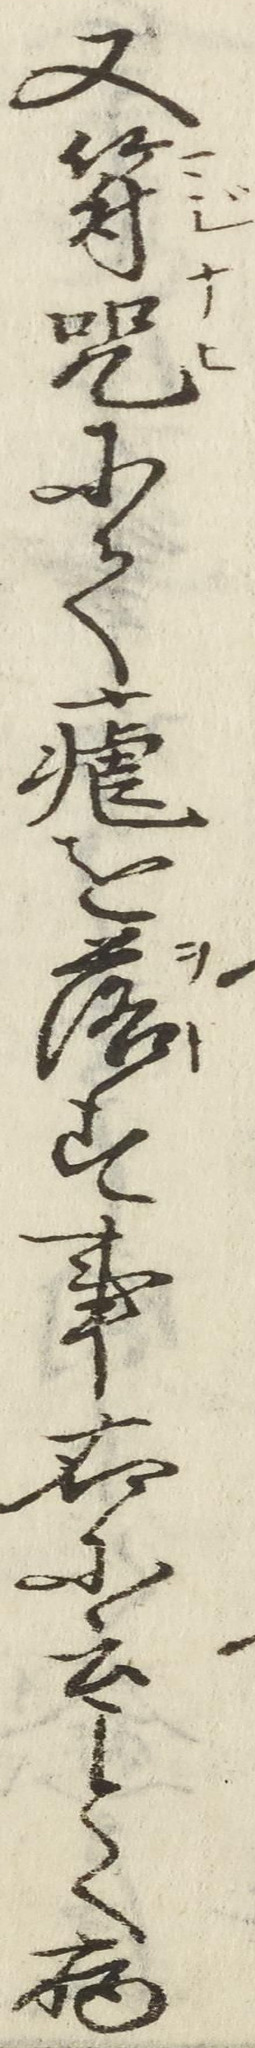又符呪にて瘧を落す事右に云ことく病
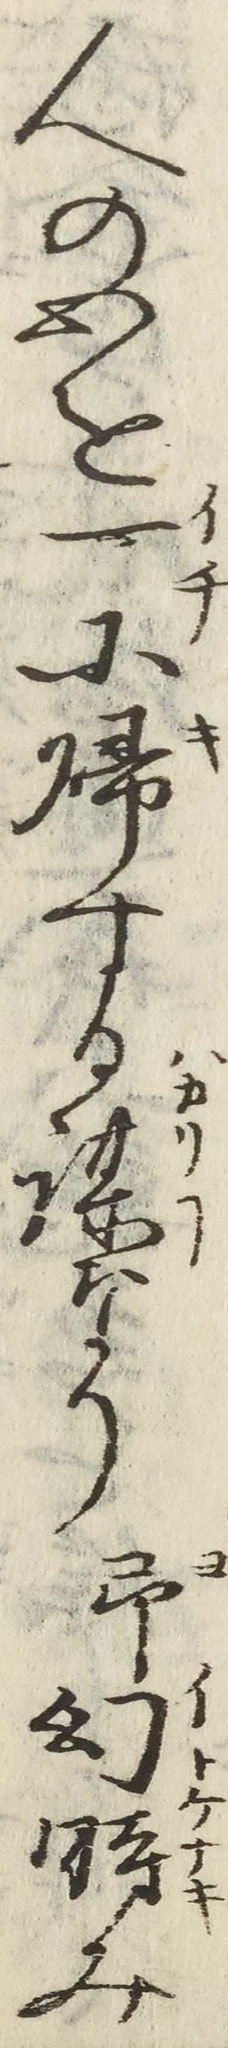人の心を一に帰する謀なり予幻時み
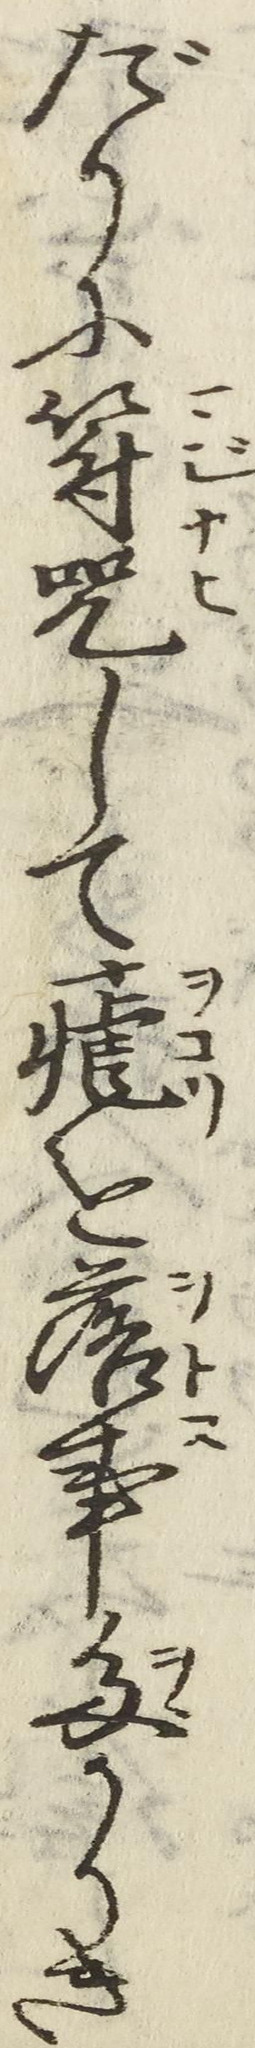だりに符呪して瘧を落事多かりき

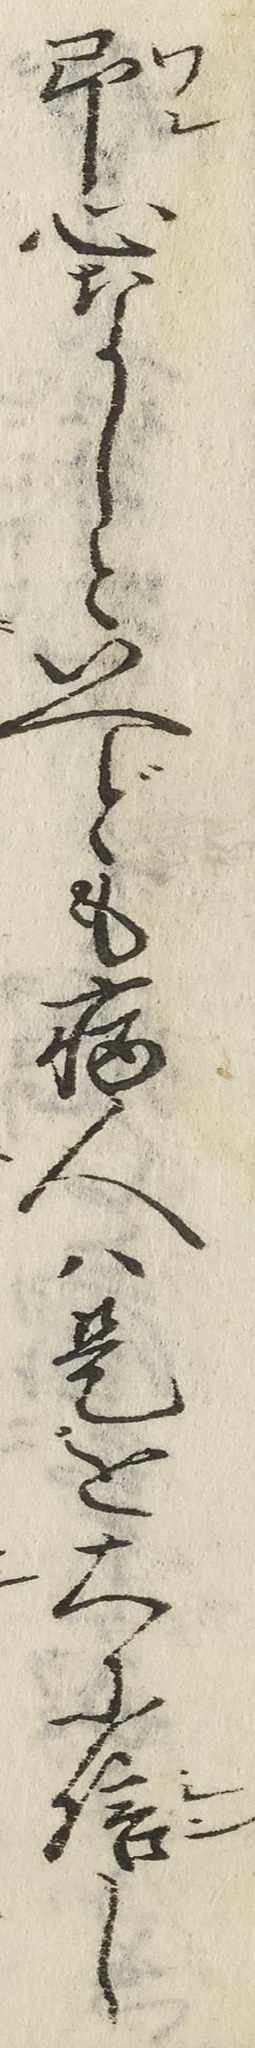予心なしといへども病人は是を大に信し
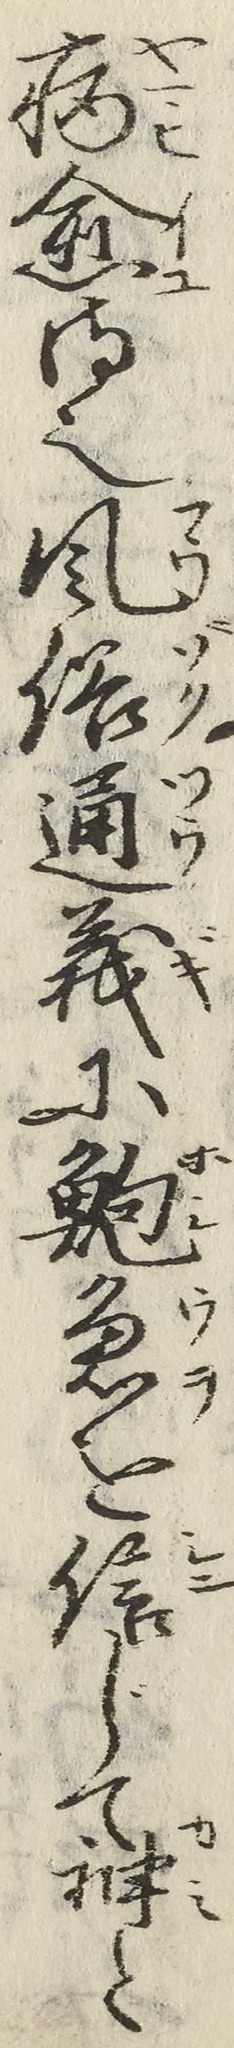病愈る也風俗通義に鮑魚を信して神と
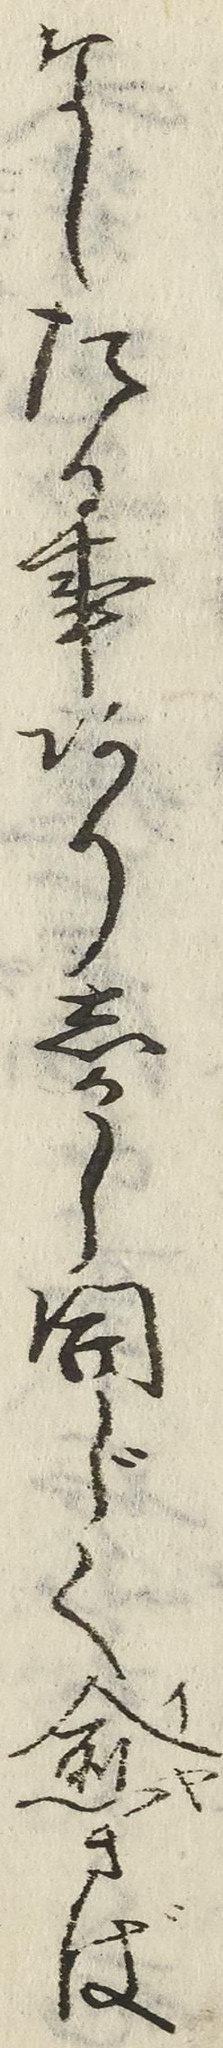なしたる事ありしかし同じく愈さば
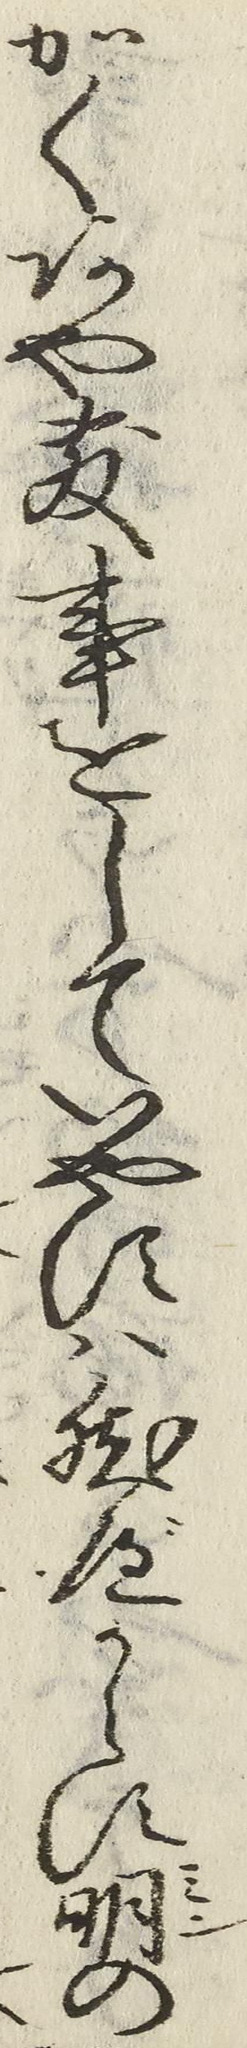かくあや敷事をしていやすは然べからす明の
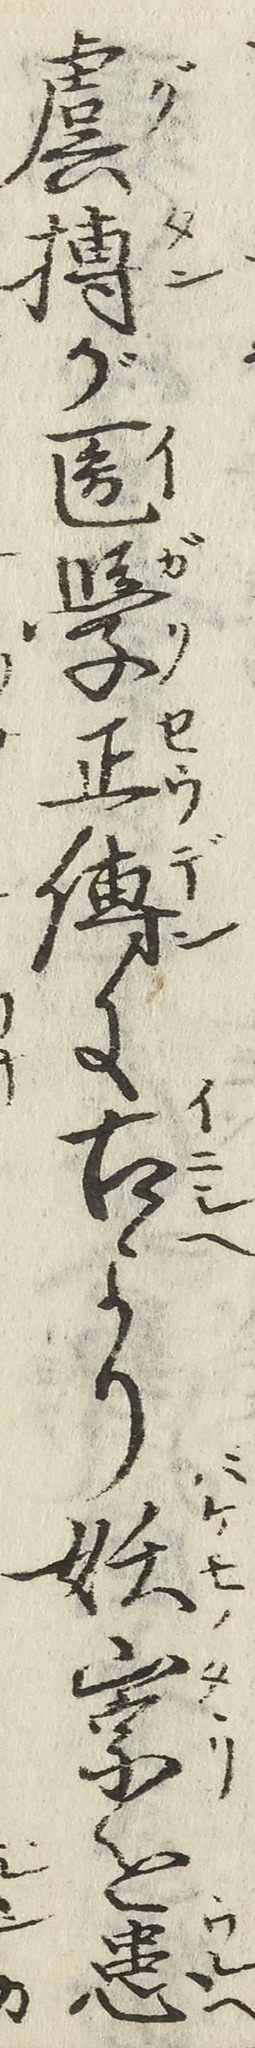虞塼が医学正伝に古より妖祟を患
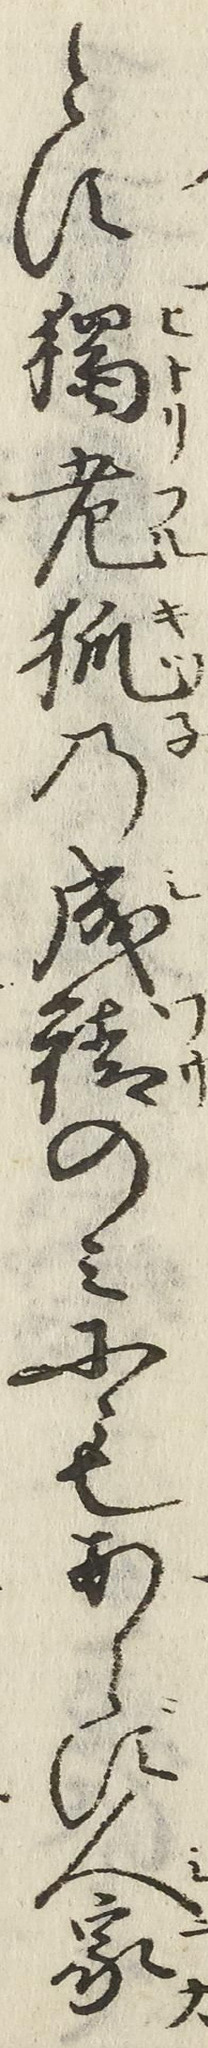とす独老狐の成精のみにもあらず人家
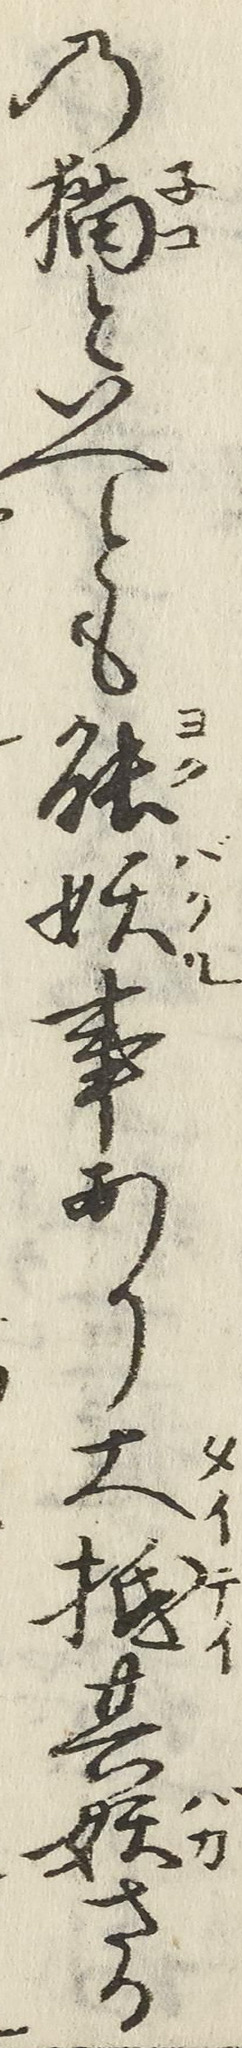の猫といへとも能妖事あり大抵其妖さる
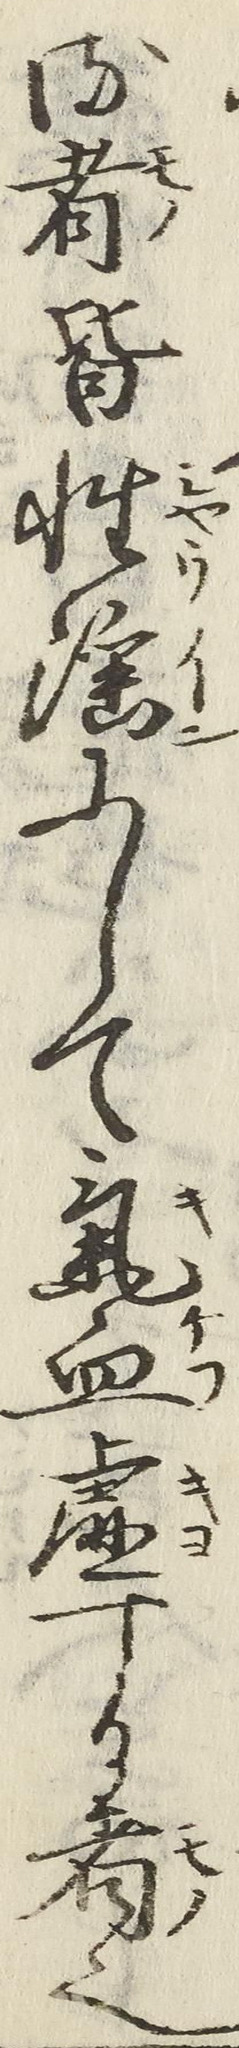る者皆性淫にして気血虚する者也
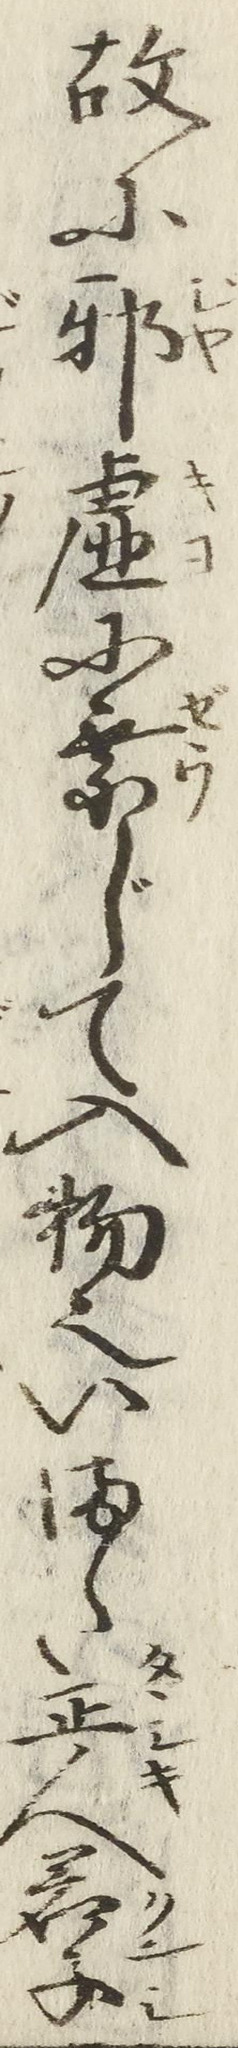故に邪虚に乗じて入物也いまた正人君子
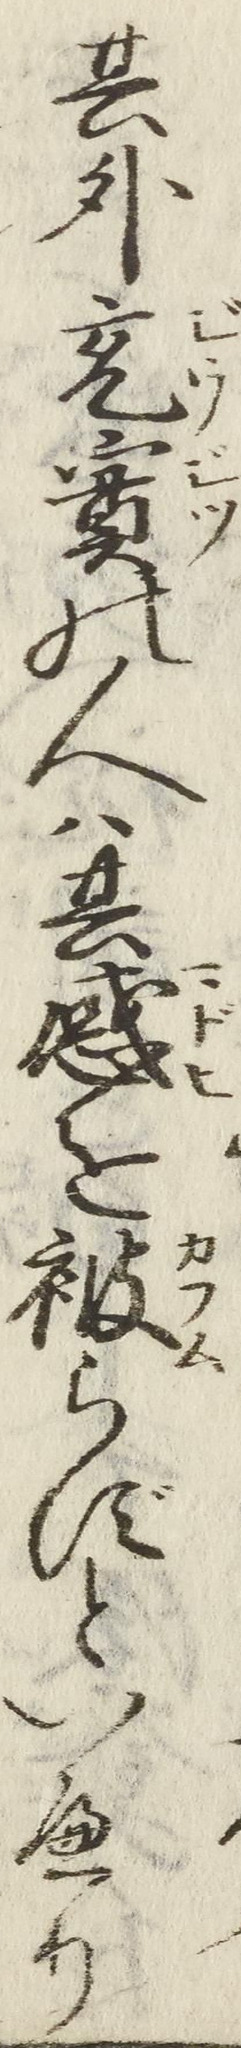其外充実の人は其惑を被らずといへり
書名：天地或問珍　地
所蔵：東京大学地震研究所図書室 Earthquake Research Institute Library, The University of Tokyo, JAPAN
